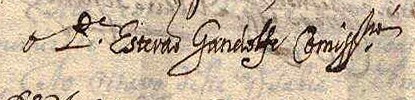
o P.e Estevaõ Gandolfe Comiss.ro
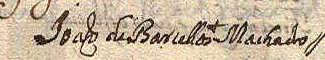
Ioaõ de Barcellos Machado //
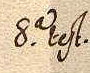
8.a test.
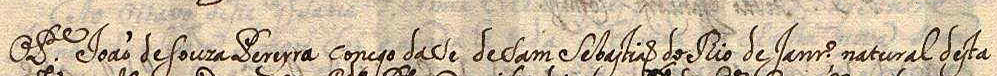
O P.e Ioaõ de souza Pereyra conego da Se de Sam Sebastiaõ do Rio de Janr.o natural desta
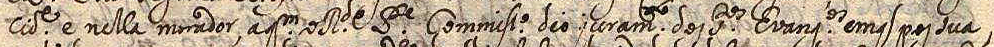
cid;e e nella morador, a q.m o R.do P.e Commiss.o deo juram.to dos s.tos Evang.os em q̄ pos sua
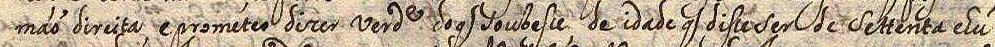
maõ direita, e prometeo dizer verd.e do q̄ soubesse de idade q̄ disse ser de settenta e hū
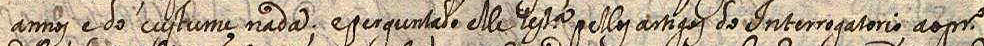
annos, e do custume nada; e perguntado elle test.a pellos artigos do Interrogatorio, ao pr.o
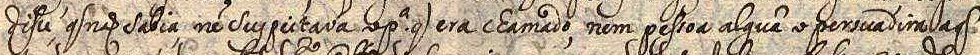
disse, q̄ naõ sabia, nē suspeitava o p.a q̄ era chamado, nem pessoa alguā o persuadira a q̄
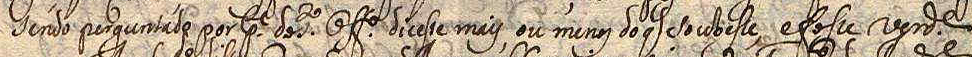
sendo perguntado por p.te do s.to Off.o dicesse mais, ou menos do q̄ soubesse, e fosse verd.e
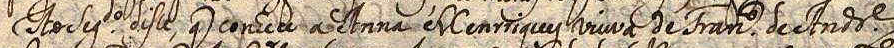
Ao Seg.do disse, q̄ conhece a Anna Henrriques viuva de Fran.co de Andr.e
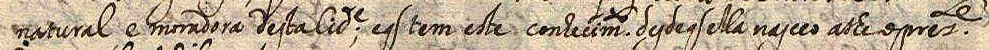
natural, e moradora desta Cid.e, e q̄ tem este conhecim.to desde q̄ ella nasceo athe o prez.te
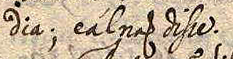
dia; e al naõ disse.
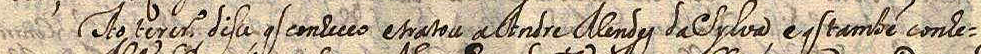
Ao tercr.o disse, q̄ conheceo e tratou a Andre Mendes da Sylva, e q̄ tambē conhe
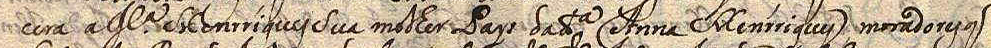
cera a M.a Henrriques Sua molher Pays da d̄a Anna Henrriques, moradores q̄
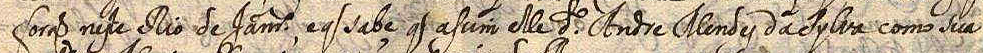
foraõ neste Rio de Janr.o, e q̄ sabe q̄ assim elle d̄.o Andre Mendes da Sylva como sua
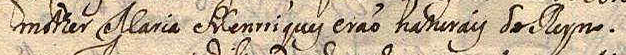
molher Maria Henrriques eraõ naturais do Reyno.
